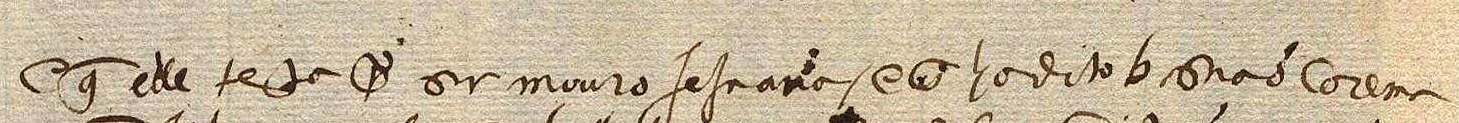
e q̄ elle testa p̄o ser mouro JeJuaua / e q̄ ho dito bastiaõ corema
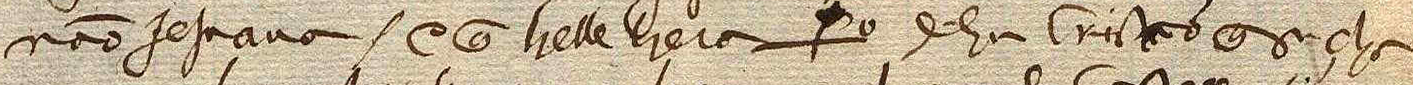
não JeJuaua / e q̄ helle hera fo de hu Cristaõ q̄ se cha
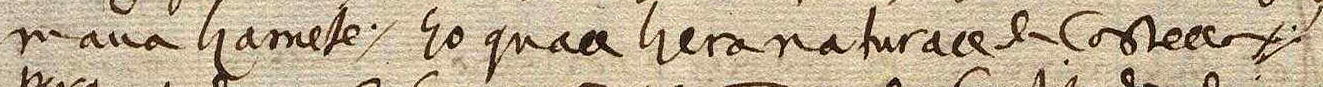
maua hamete ./ E o quall hera naturall de Castella //
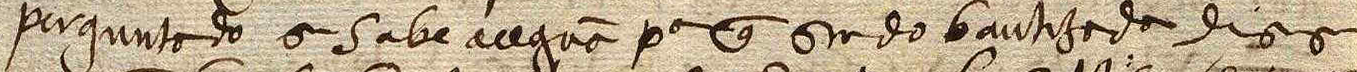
perguntado se sabe allguā pa q̄ sendo bautizada disese
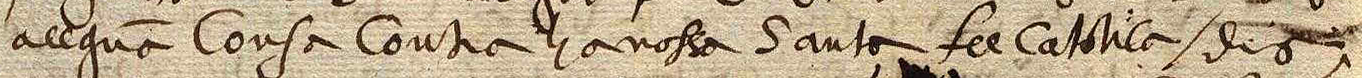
allguā Cousa Contra ha nossa santa fee Catolica / dise
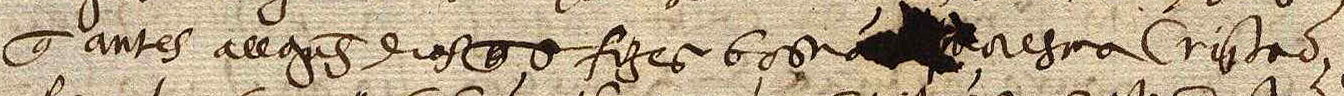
q̄ antes allgūs dias q̄ o fizese bastia_ coresma Cristaõ
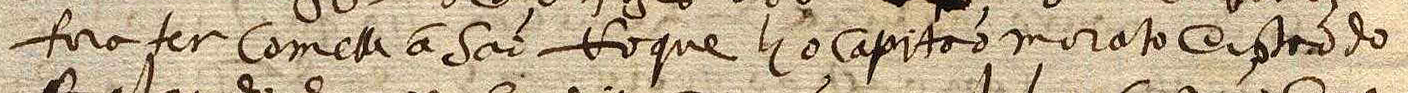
fora ter com elle a saõ Roque ho Capitaõ morato e estādo
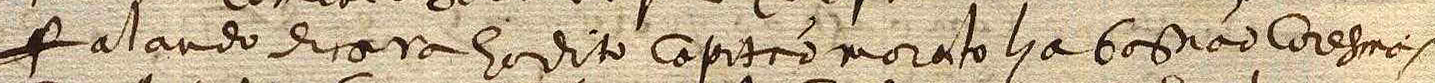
falando dissera ho dito capitaõ morato ha bastiaõ coresma /
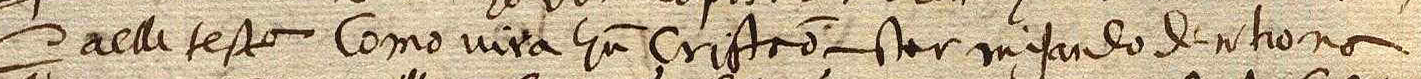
e a elle testa Como uira hū Cristaõ estar miJando dentro na
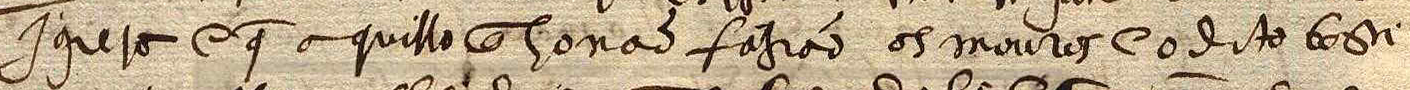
Jgreja e q̅ aquillo q̅ ho naõ faziaõ os mouros e o dito basti
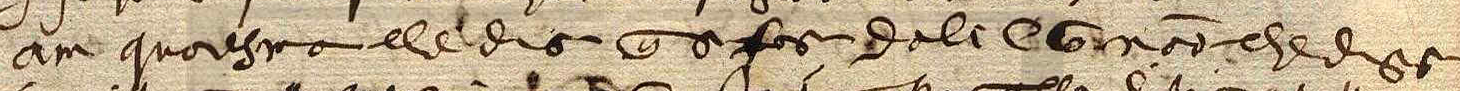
am quaresma lhe dise q̅ se fose dali e q̄ não lhe disse
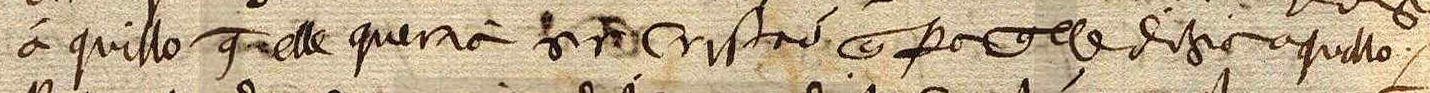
áquillo q̄ elle queria ser cristaõ q̄ ꝑa q̄ lhe dizia aquillo ./
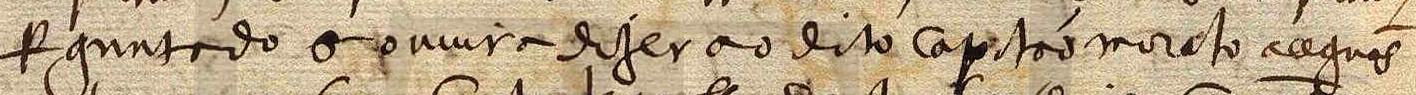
ꝑguntado se ouuira dizer ao dito capitão morato allguas̄
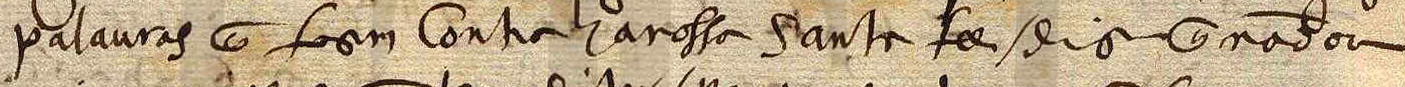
palauras q̅ fosem Contra ha nossa Santa fee / dise q̅ não ou
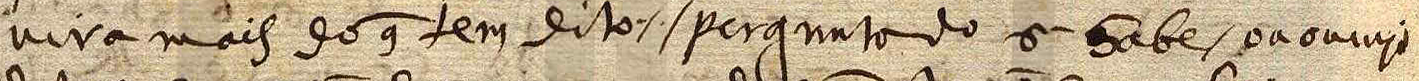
uira mais do q̄ tem dito // perguntado se sabe / ou ouujo
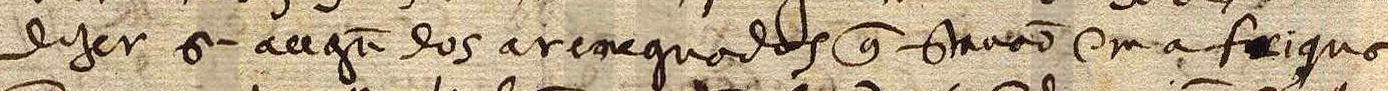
dizer se allgū dos areneguados q̄ estauaõ em afriqua
